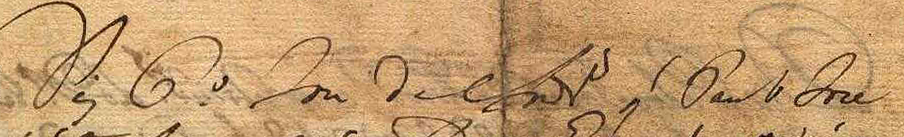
Dis G.o Ioze de Andre q̄ Paulo Ioze
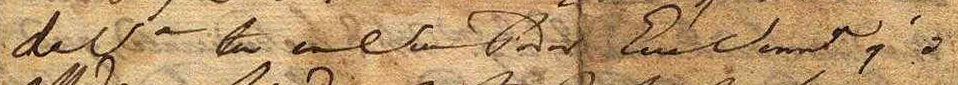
da sa ten en seu Poder hua Senn.a q̄ o
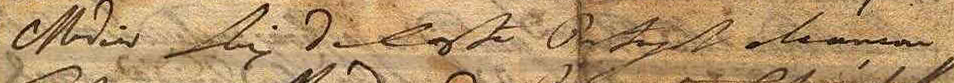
Medico Luis de Costa Portugal alcançou
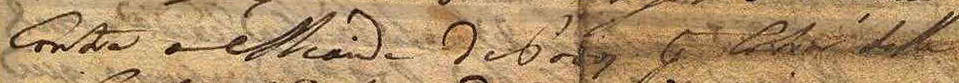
Contra o Alcaide de Portos p̄ Cobrar della
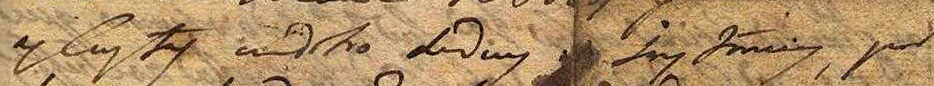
as Custas en dobro de duas _ Instruçois, por
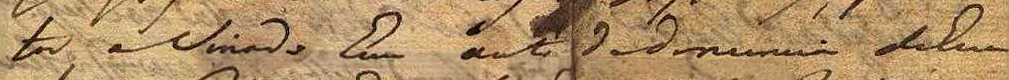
ter asinado hum auto de denuncia de hua
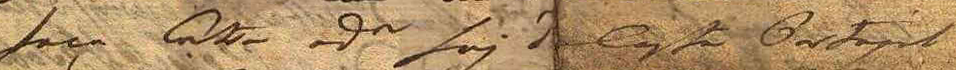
faça Contra o d.o Luis d Costa Portugal
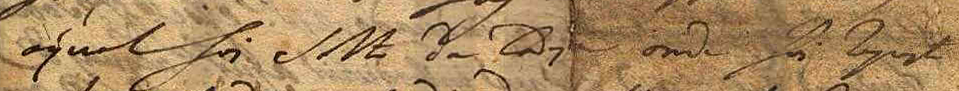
o qual foi Solto da Cadeya onde foi Reposto
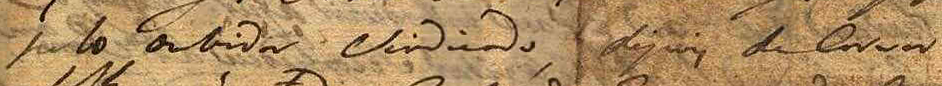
pelo ouvidor sindicado, dipois de Correr
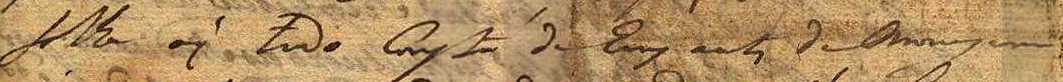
folha o q̄ tudo Consta de huns autos de Omeagem
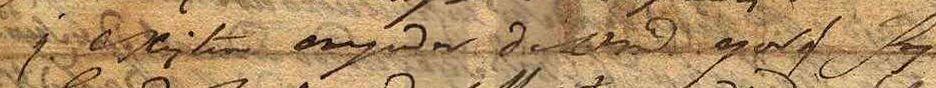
q̄ existem em poder de vme e porq̄ fas
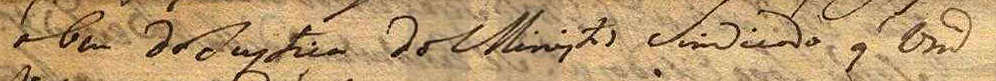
a ben da Iustiça do Ministo Sindicado q̄ V m.e
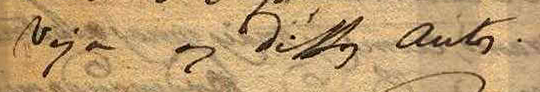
veja os dittos autos.
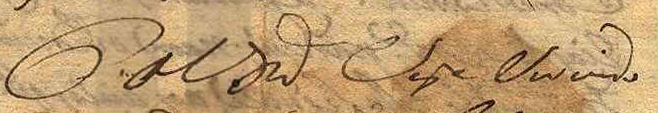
P. a Vme Seje servido
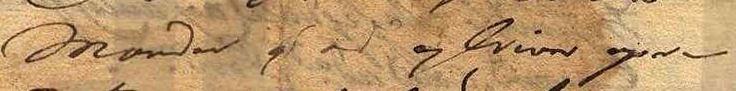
mandar q̄ o do esCrivan apre
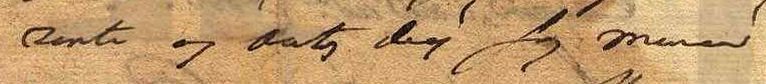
zente os autos de q̄ fas mençaõ
